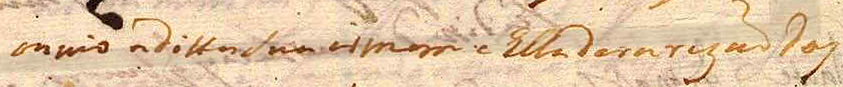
ouvio a ditta sua irmam e Ella dera rezaõ das
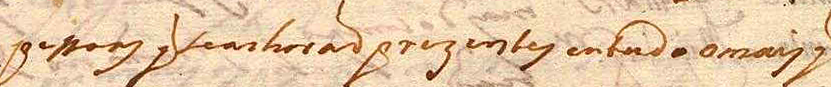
pessoas q̄ se as heraõ prezentes en tudo o mais q̄
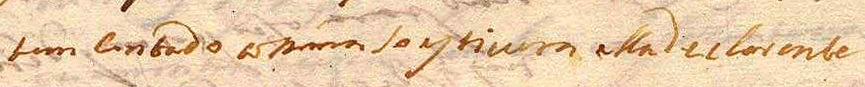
tem contado assima so estiuera ella declarante
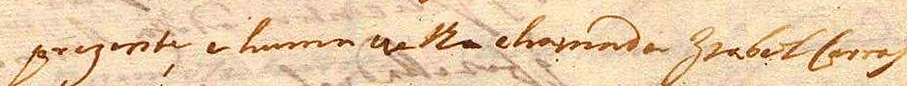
prezente, e huma uelha chamada Jzabel Carras
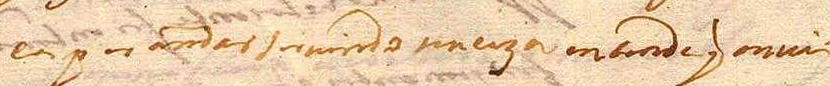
ca por andar servindo na caza entende q̄ ouvio
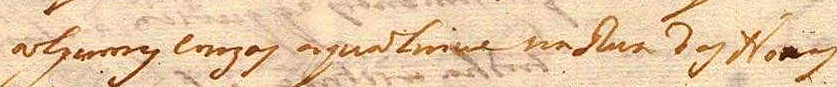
algumas cousas a qual viue na Rua das Noras
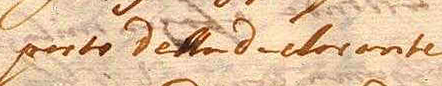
perto della declarante
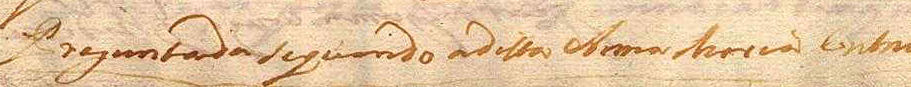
Preguntada se quando a ditta Anna Maria contou
